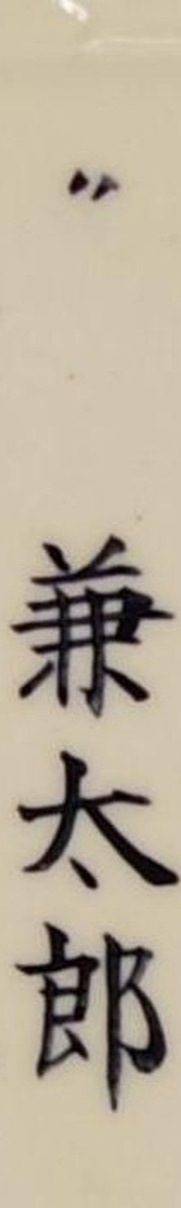兼太郎
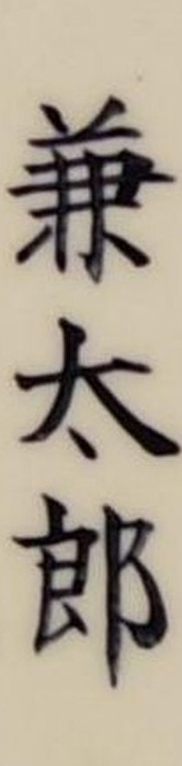兼太郎
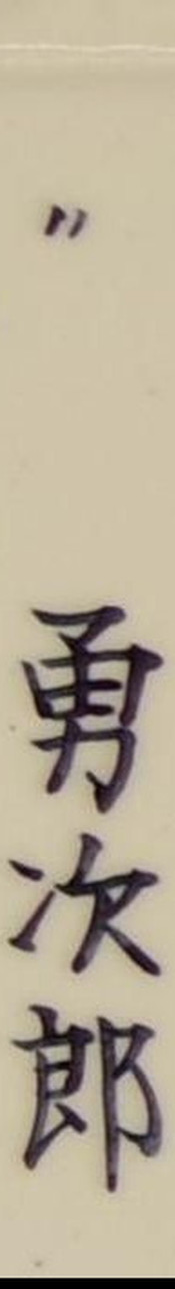勇次郎
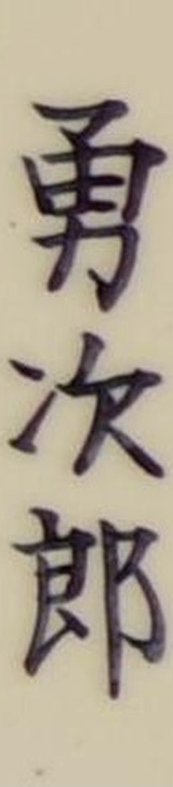勇次郎
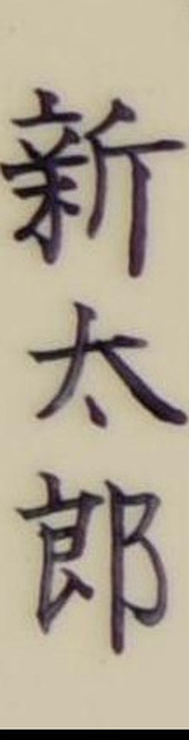新太郎

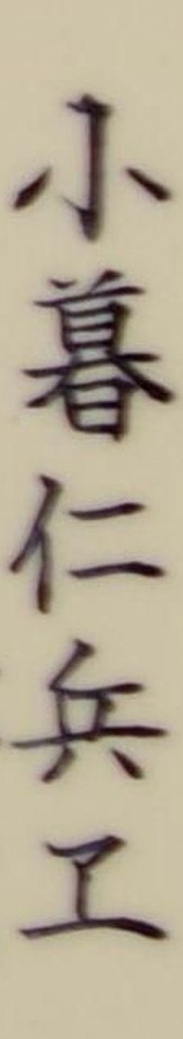小暮仁兵エ
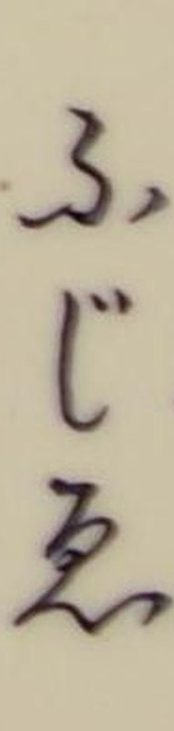ふじえ
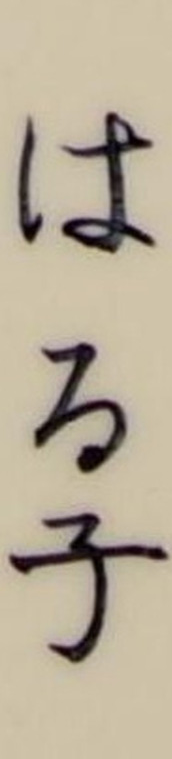はる子
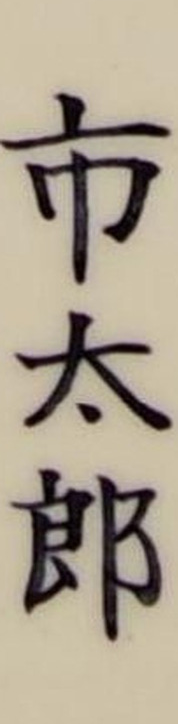市太郎

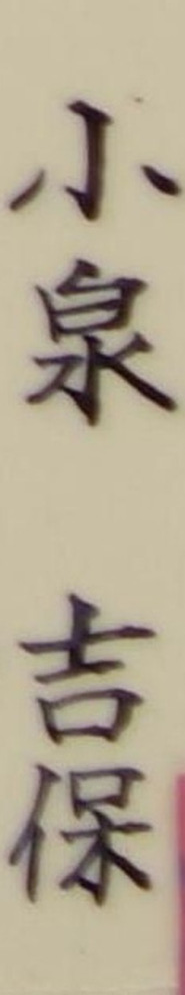小泉吉保
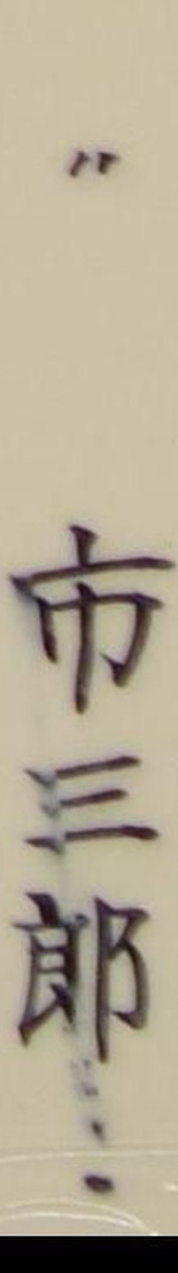市三郎
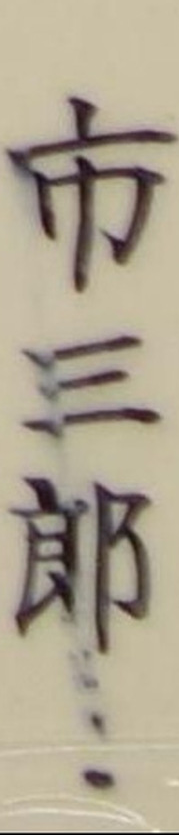市三郎
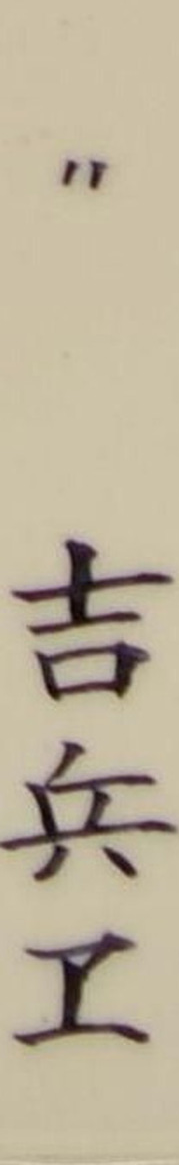吉兵エ
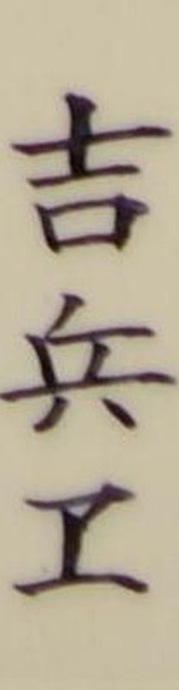吉兵エ
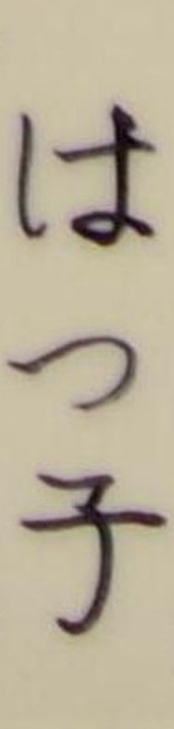はつ子
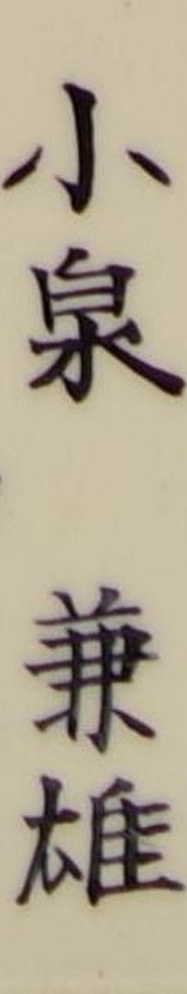小泉兼雄
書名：E~L
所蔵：高野山金剛峯寺
